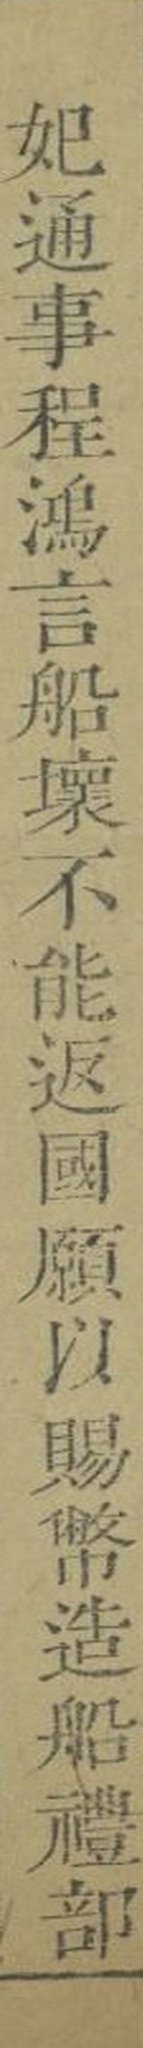妃通事程鴻言船壊不能返国願以賜幣造船礼部
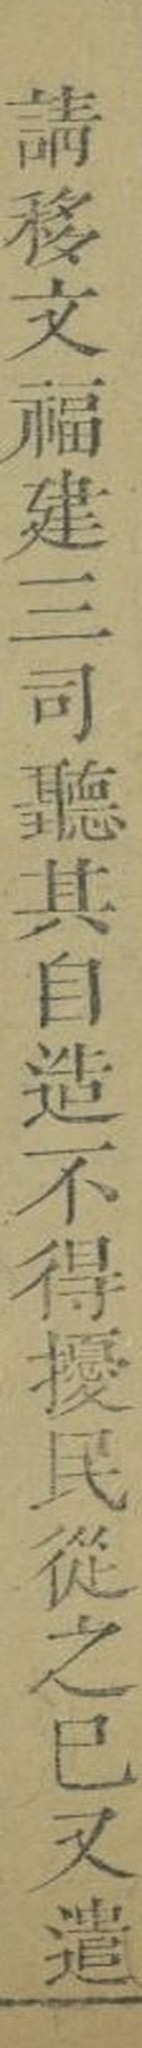請移文福建三司聴其自造不得擾民従之巳又遣
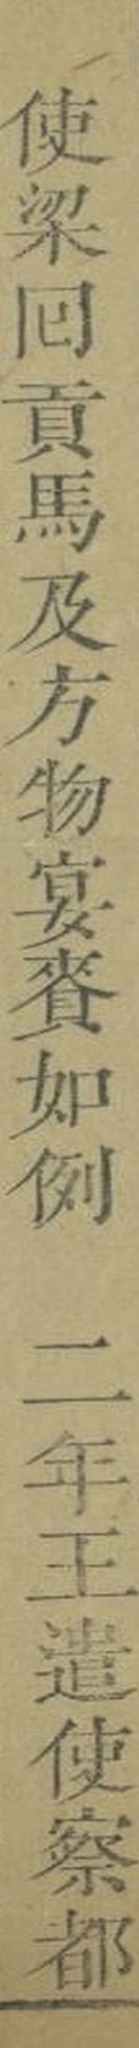使梁回貢馬及方物宴賚如例二年王遣使察都
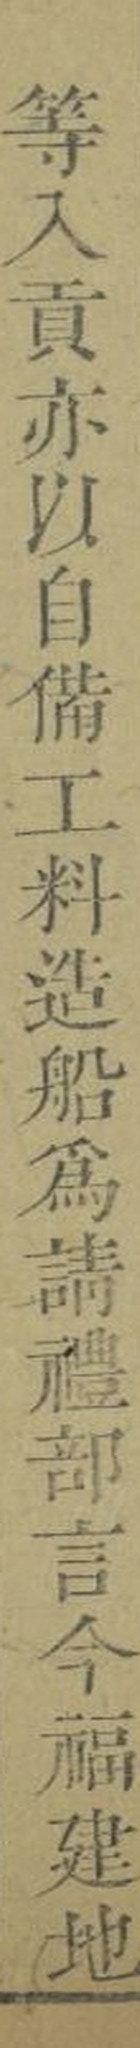等入貢亦以自備工料造船為請礼部言今福建地
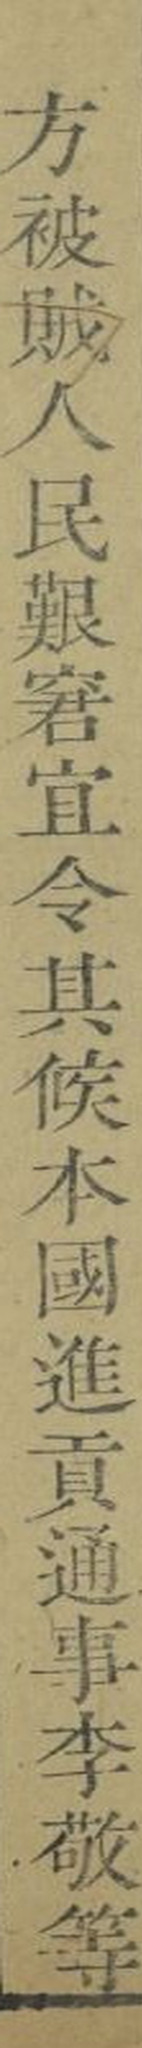方被賊人民艱窘宜令其候本国進貢通事李敬等
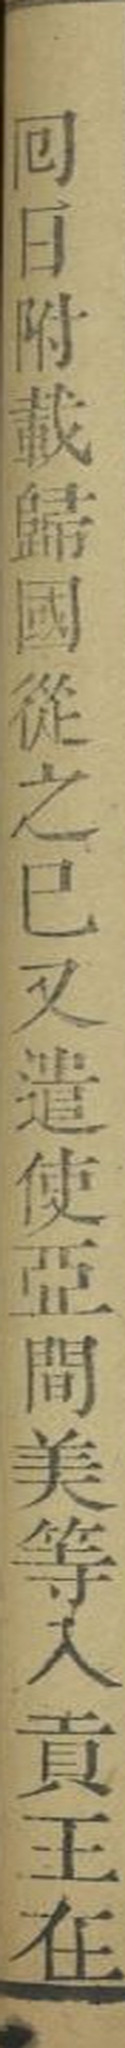回日附載帰国従之巳又遣使亜間美等入貢王在
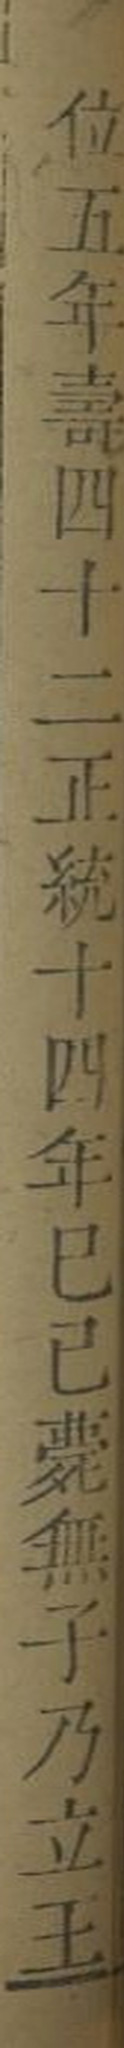位五年寿四十二正統十四年巳已薨無子乃立王
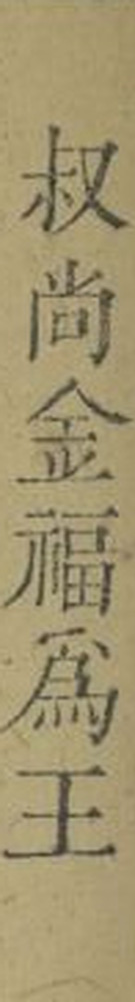叔尚金福為王
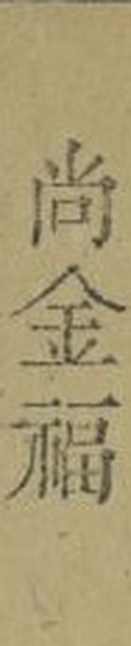尚金福
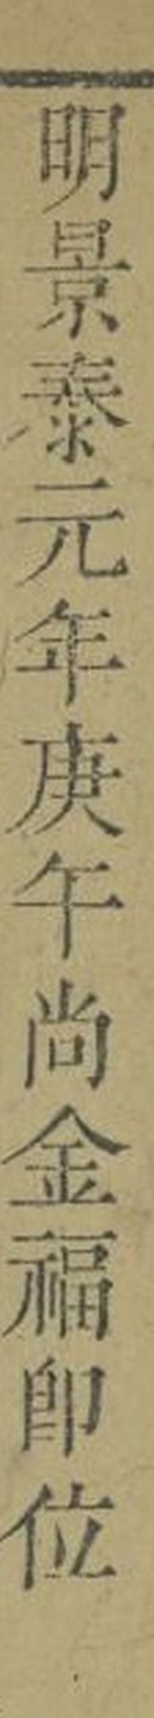明景泰元年庚午尚金福即位
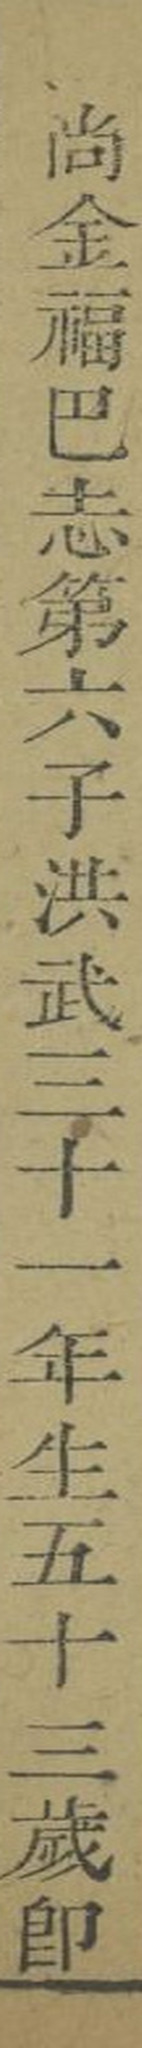尚金福巴志第六子洪武三十一年生五十三歳即
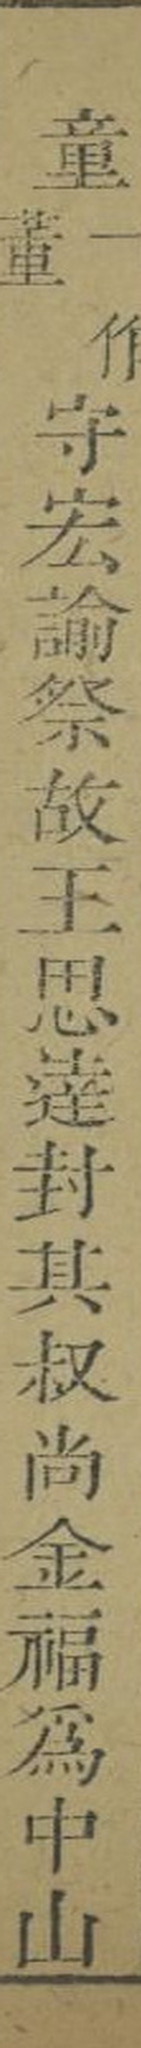童一作董守宏諭祭故王思達封其叔尚金福為中山
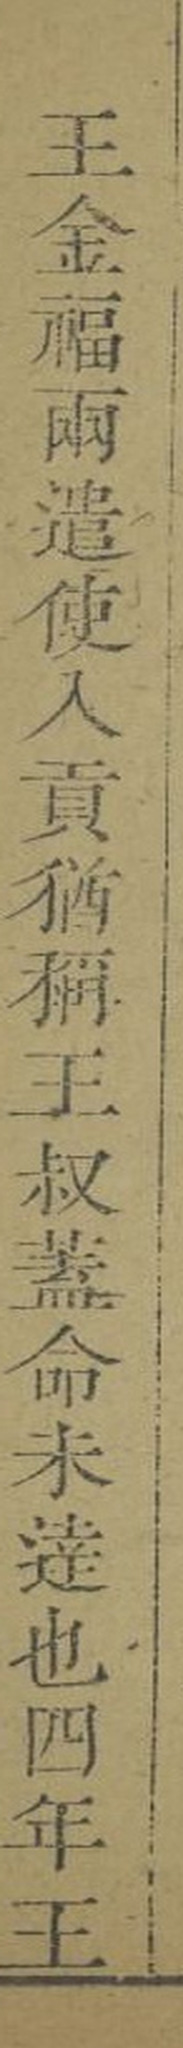王金福両遣使入貢猶称王叔蓋命未達也四年王
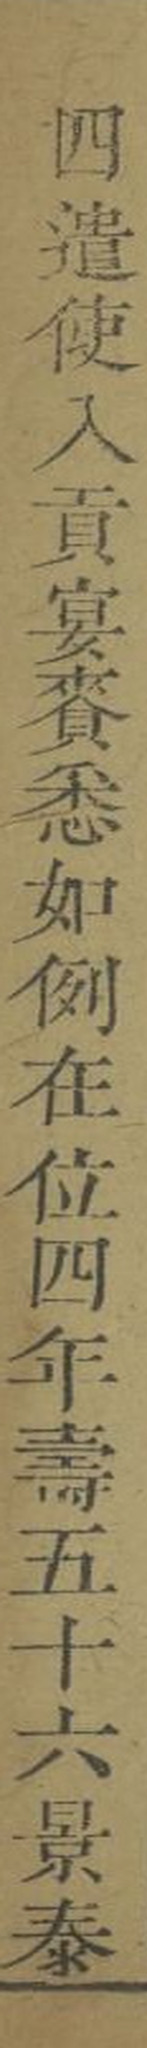四遣使入貢宴賚悉如例在位四年寿五十六景泰

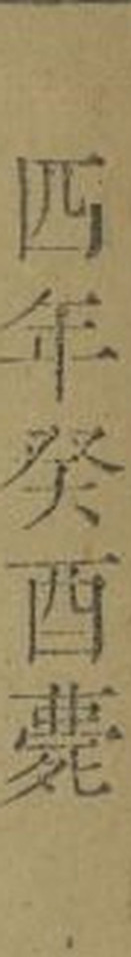四年癸酉薨
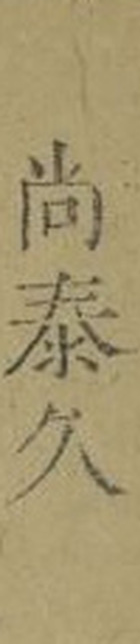尚泰久
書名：中山伝信録 巻三
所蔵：University of the Ryukyus Library
